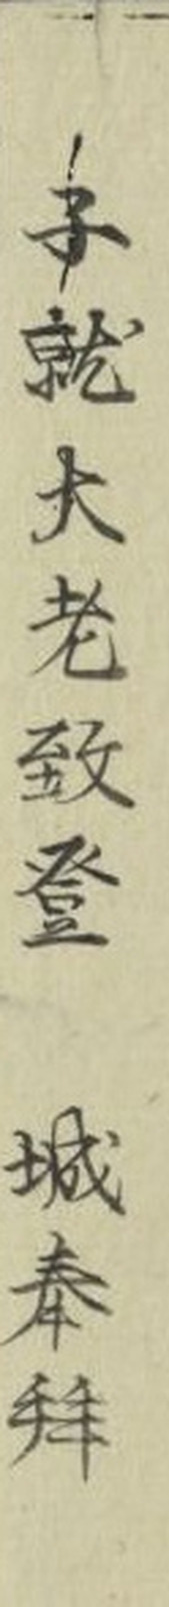子就大老到登城奉拝
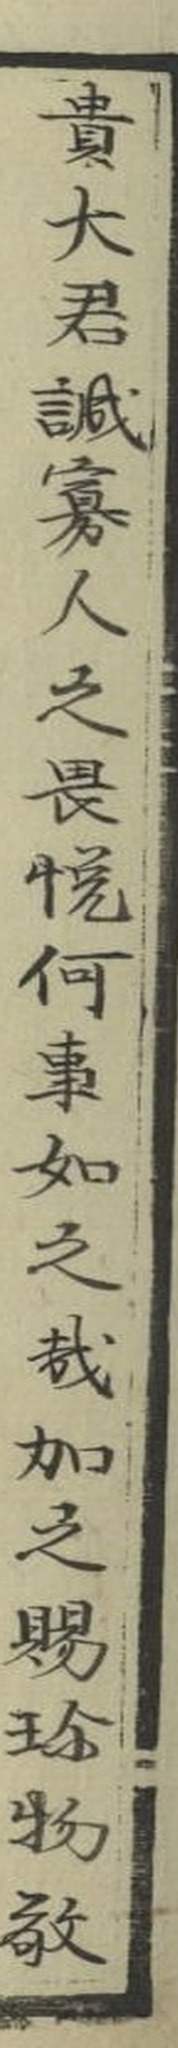貴大君誠寡人之畏悦何事如之裁加之賜珍物敬
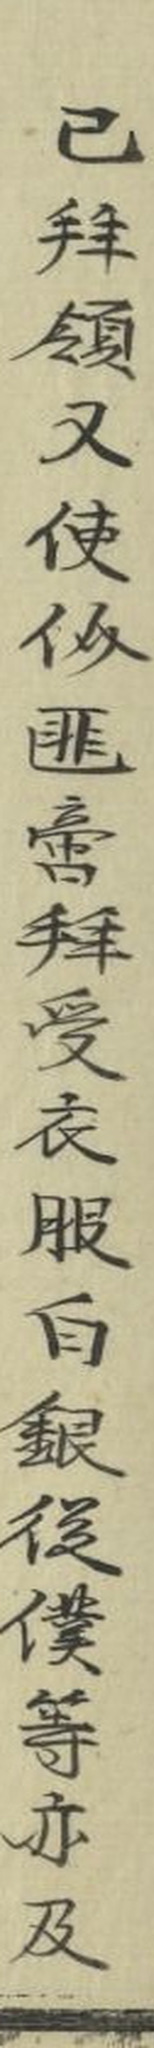已拝領又使价匪啻拝受衣服白銀従僕等亦及
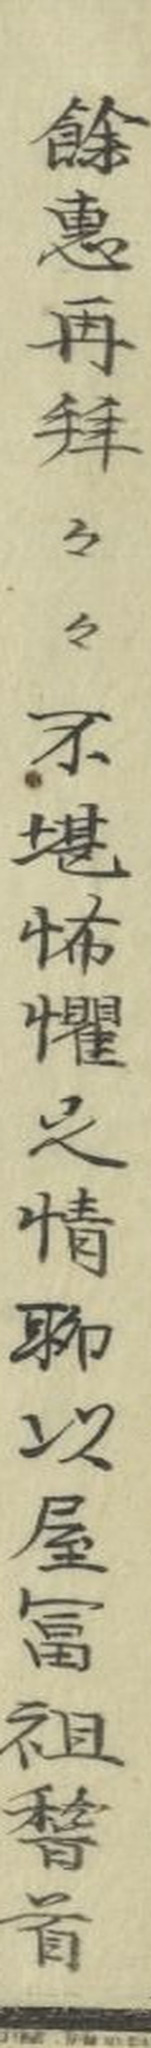余恵再拝々々不堪恐懼之情聊以屋富祖稽首
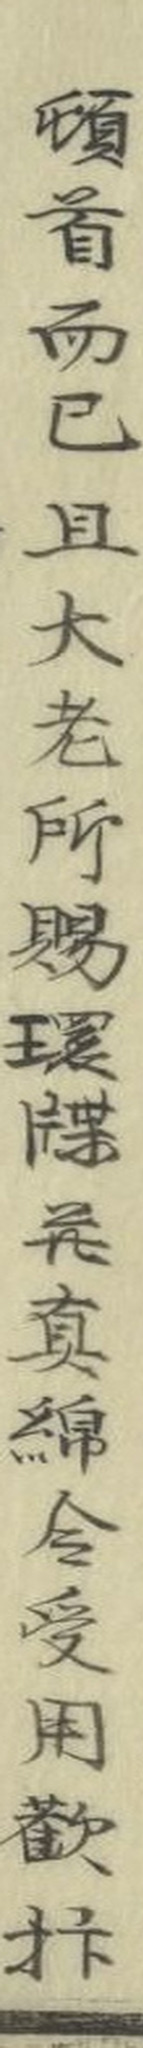頓首而巳且大老所賜環牒幷真綿令受用歡扑
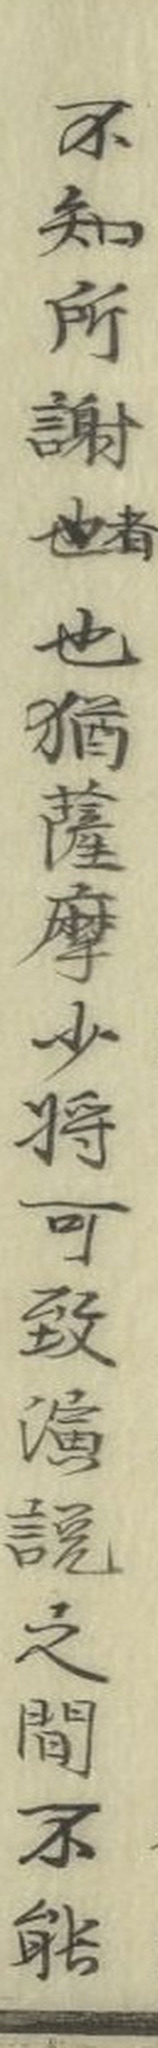不知所謝者也猶薩摩少将可致演説之間不能
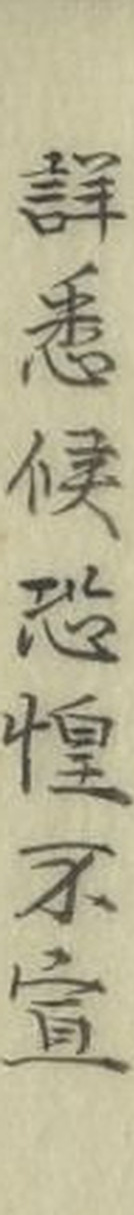詳悉候恐惶不宣
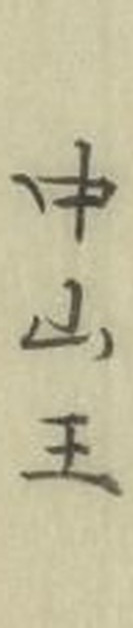中山王
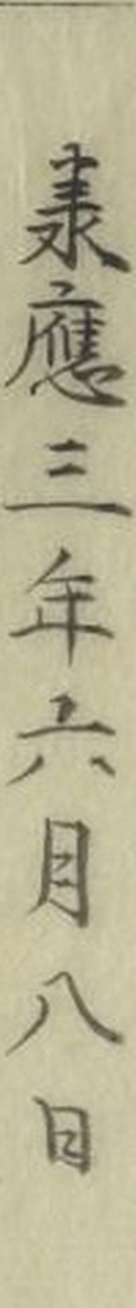承応三年六月八日尚質
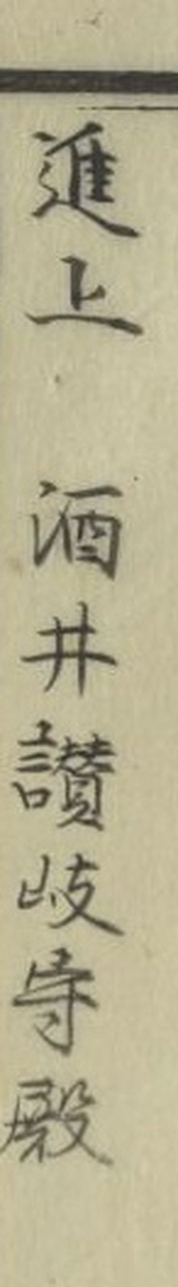進上酒井讃岐守殿

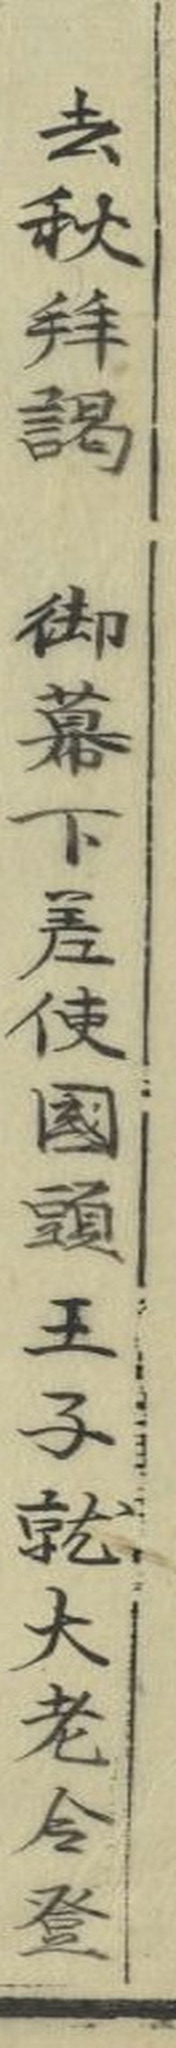去秋拝謁御幕下差使国頭王子就大老令登
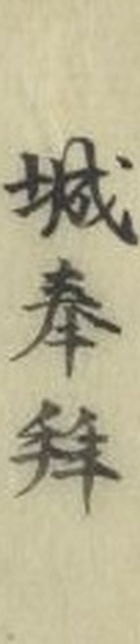城奉拝
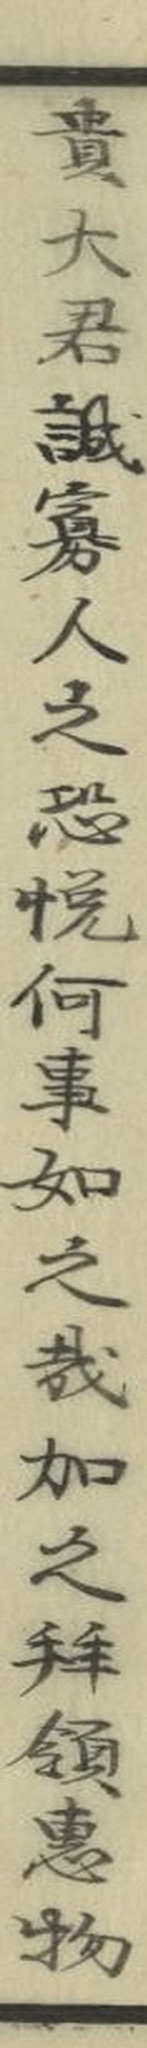貴大君誠寡人之恐悦何事如之裁加之拝領恵物
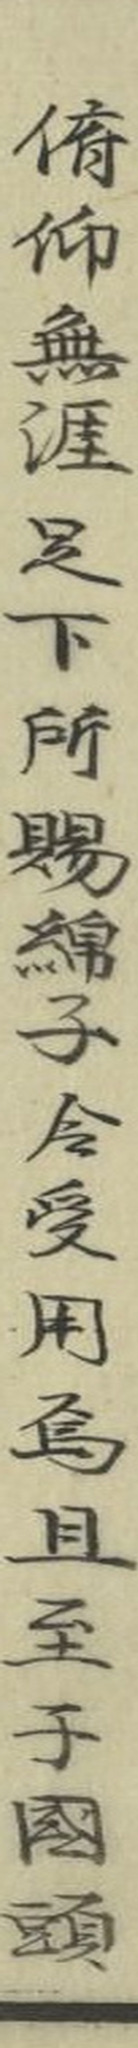俯仰無涯足下所賜綿子令受用焉且至子国頭
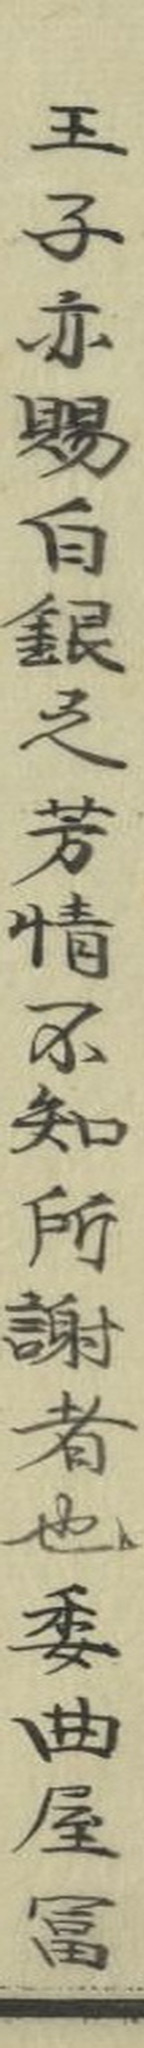王子亦賜白銀之芳情不知所謝者也委曲屋富
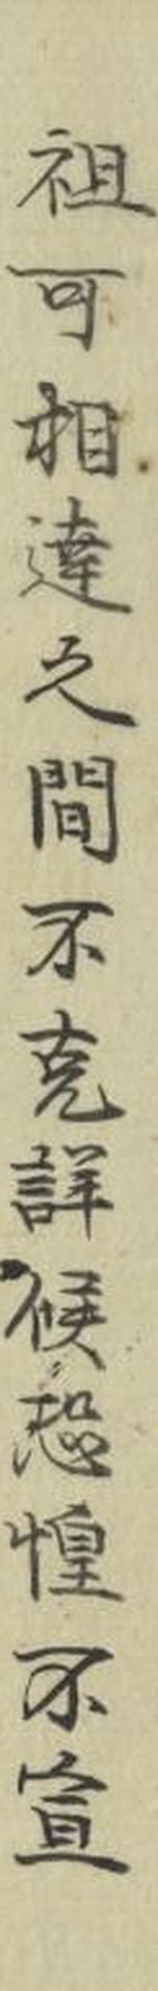祖可相違之間不克詳候恐惶不宣
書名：琉球往来（上）
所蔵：University of the Ryukyus Library
